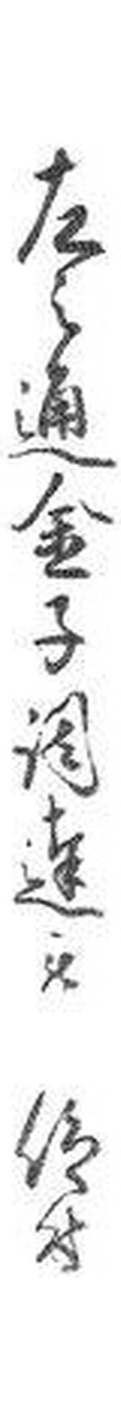左之通金子調達被仰付
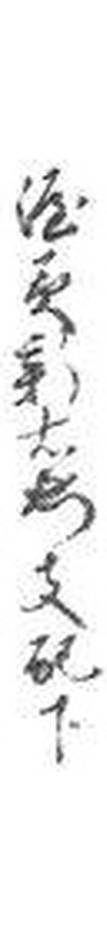渥美新右衛門支配下
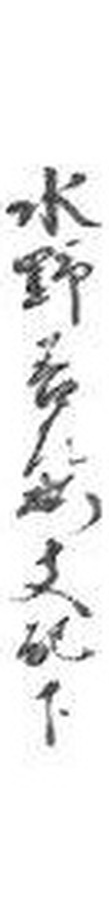水野善左衛門支配下
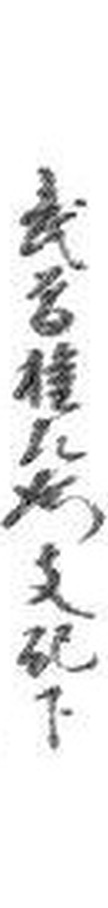武曾権左衛門支配下
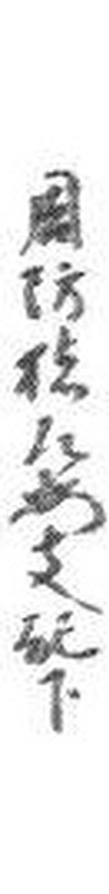周防猪左衛門支配下
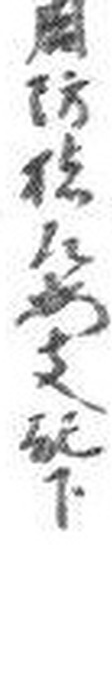周防猪左衛門支配下
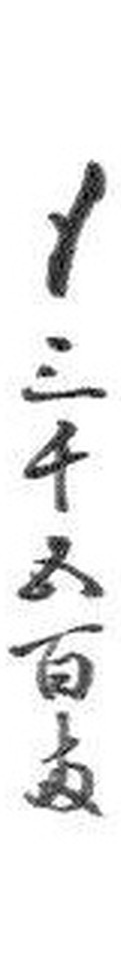〆三千五百両
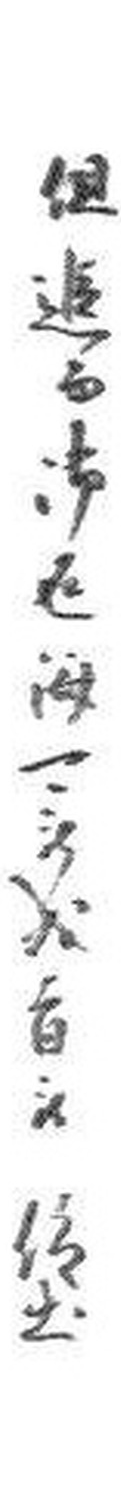但追而御返済可被成旨被仰出
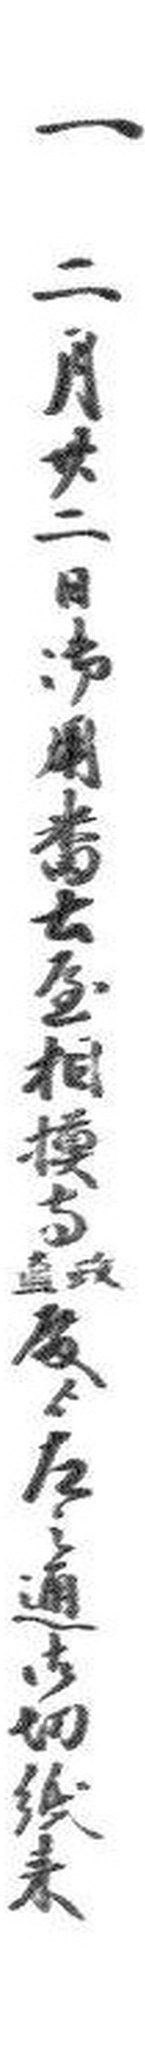一二月廿二日御用番土屋相模守政直殿ゟ左之通御切紙来
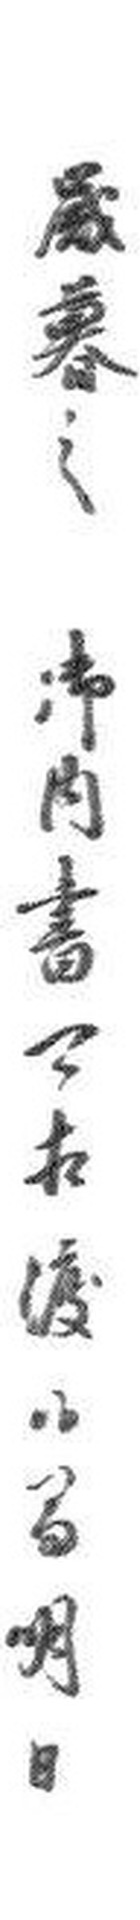歳暮之御内書可相渡候間明日

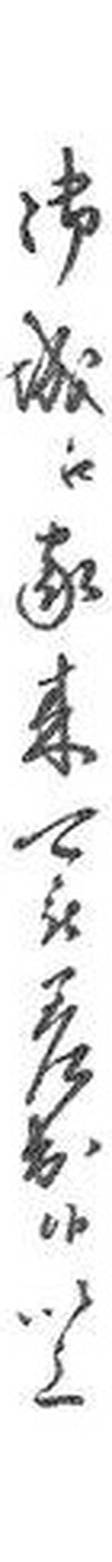御城江家来可被差出候以上
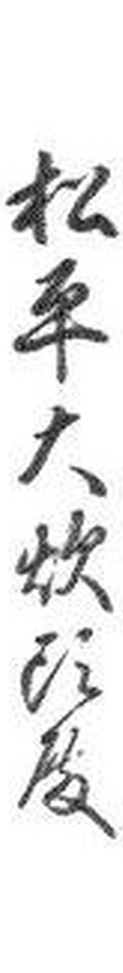松平大炊頭殿
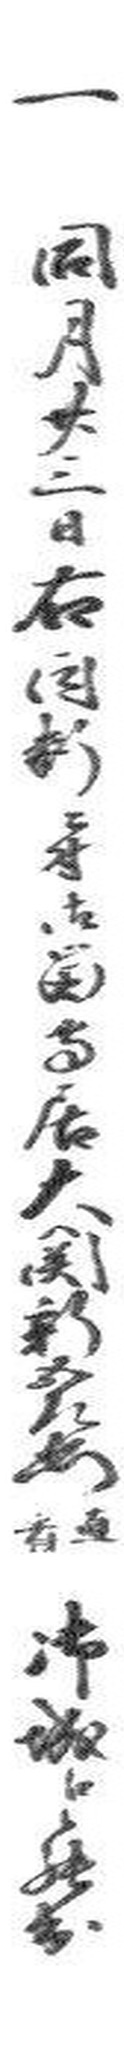一同月廿三日右同断ニ付御留守居大関新五左衛門直看御城江罷出
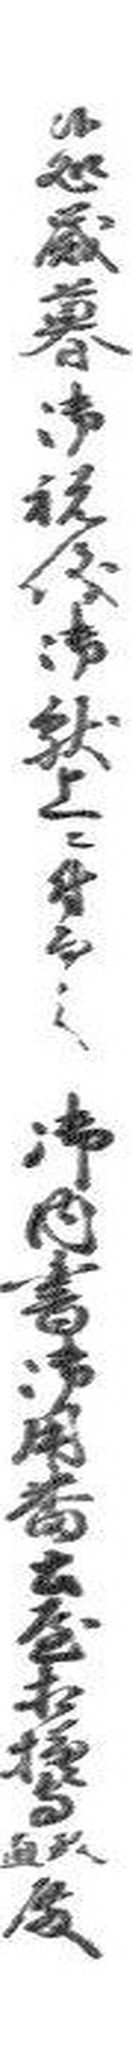候処歳暮御祝儀御献上ニ付而之御内書御用番土屋相模守政直殿
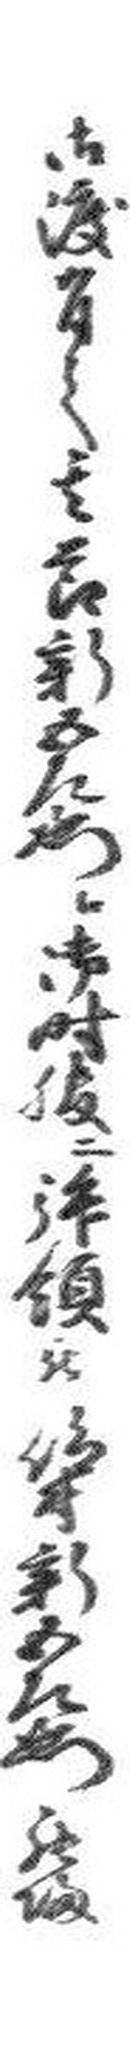御渡有之其節新五左衛門江御時服二拝領被仰付新五左衛門罷帰
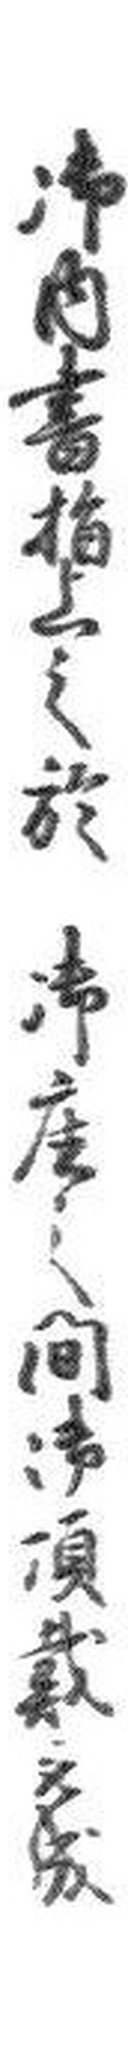御内書指上之於御座之間御頂戴被成
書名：家譜 二十八 吉邦公 従宝永七年七月五日到正徳元年十二月
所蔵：福井県文書館 Fukui Prefectural Archives
